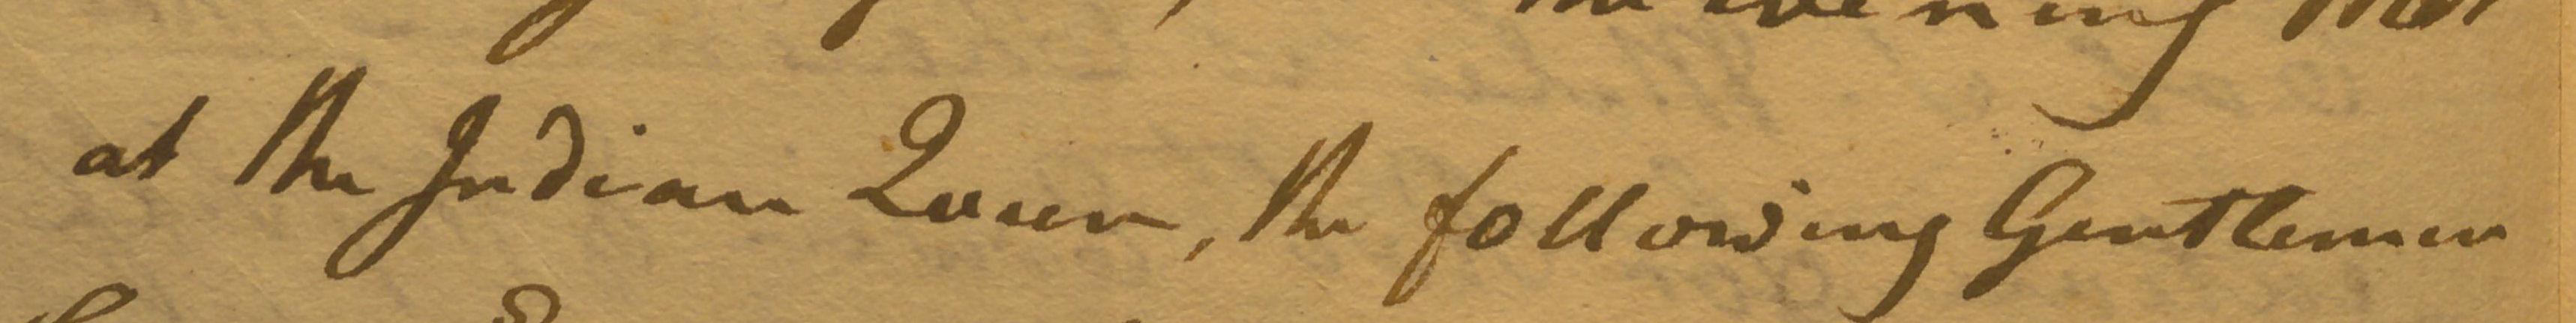at the Indian Queen the following Gentlemen
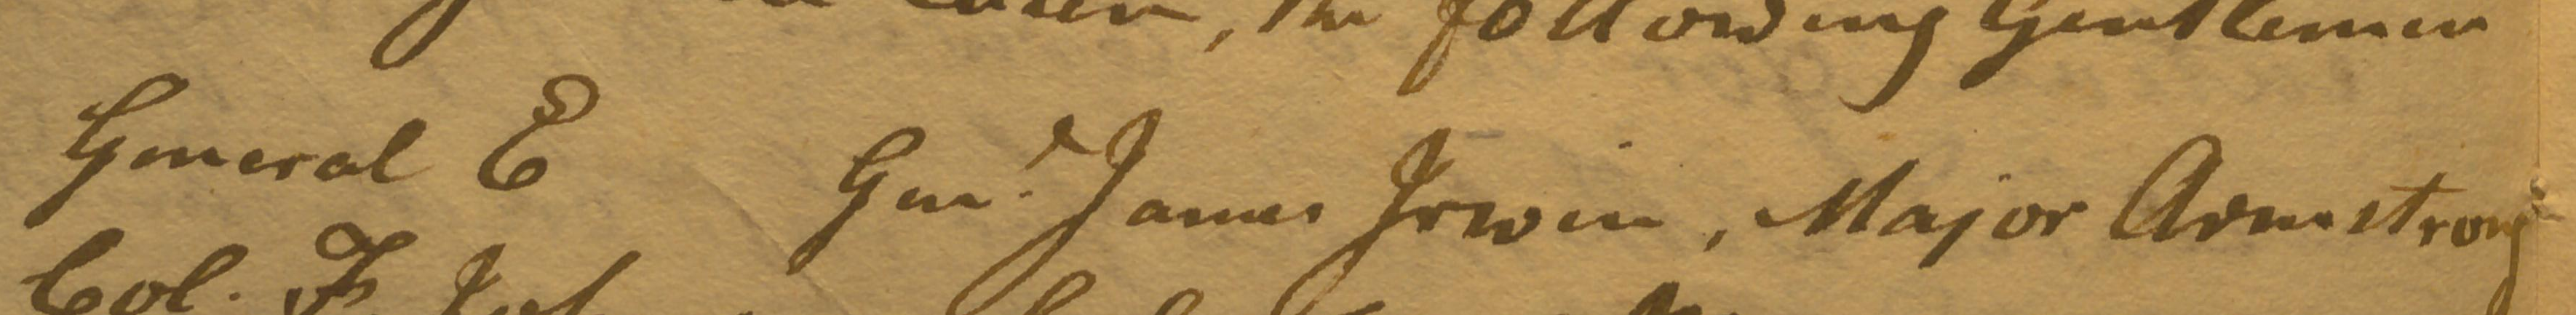General E Gen^l. James Irwin, Major Armstrong
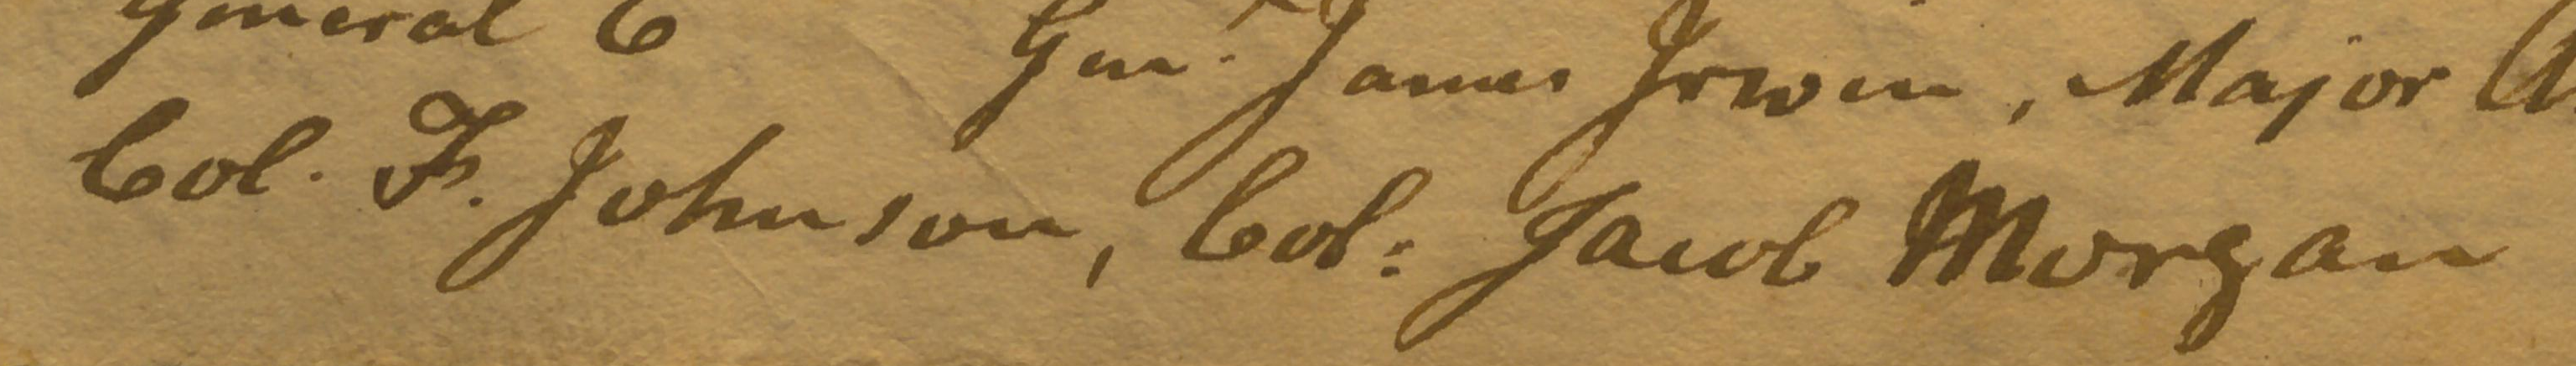Col. F. Johnson, Col: Jacob Morgan
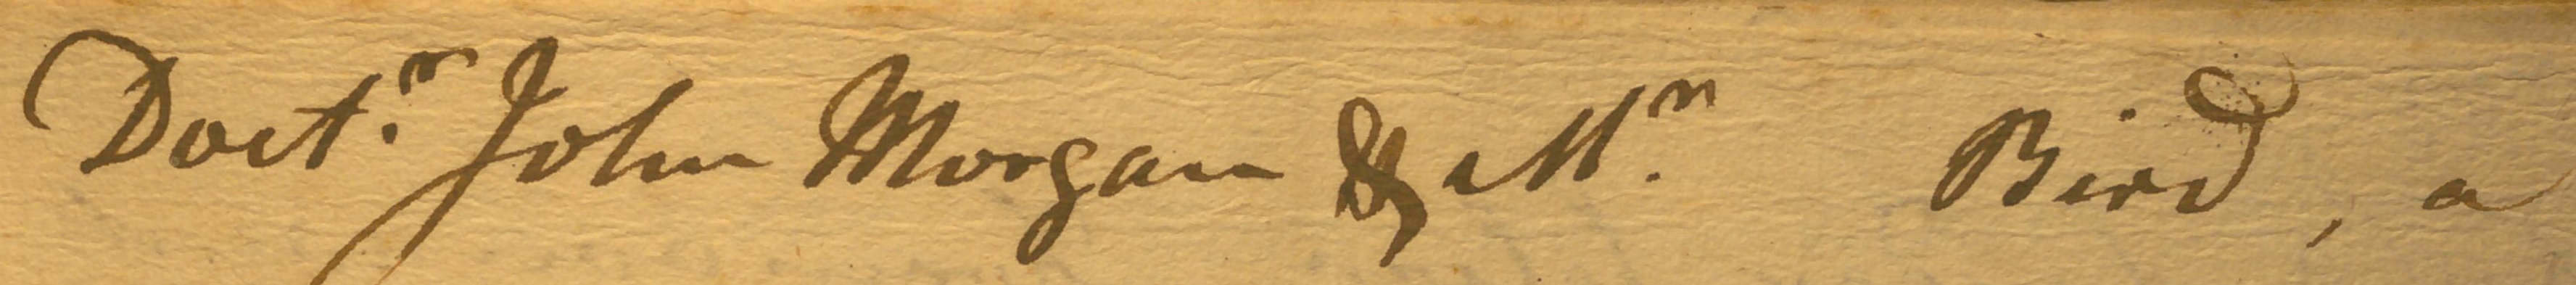Doct^r. John Morgan & M^r. Bird, a
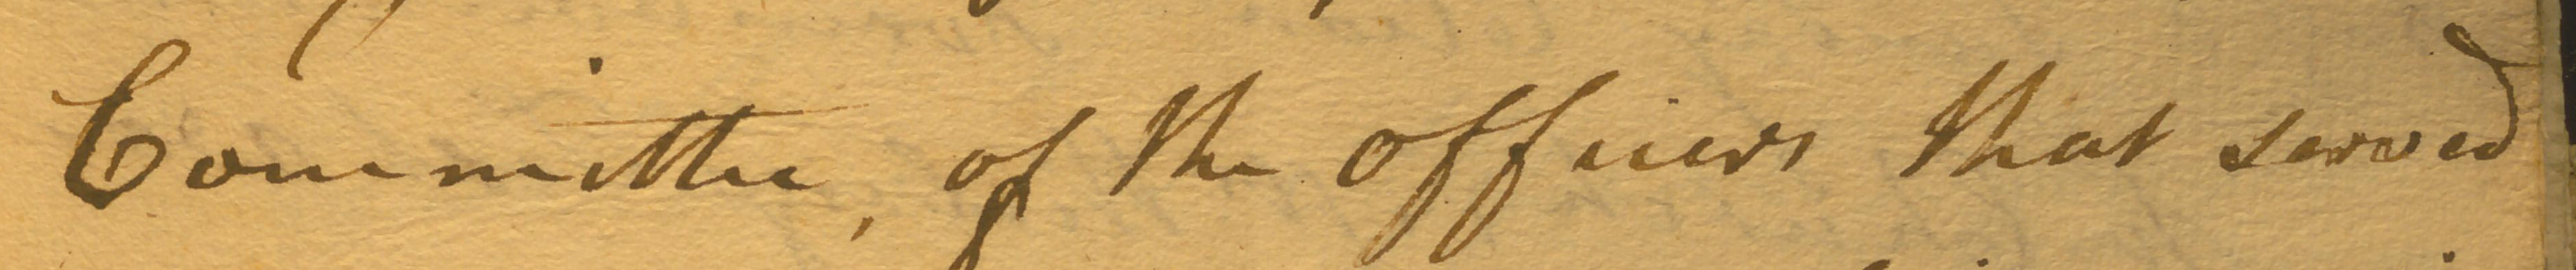Committee, of the officers that served
